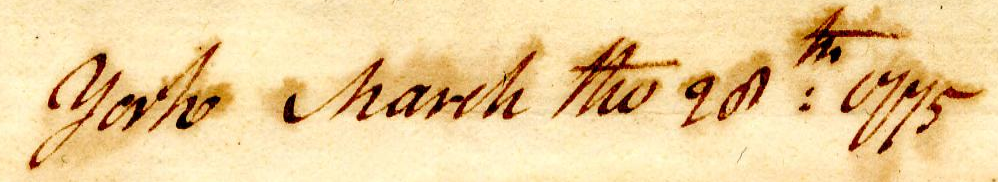York March the 20^th: 1775
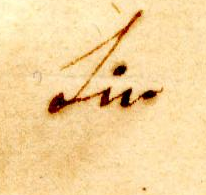Sir
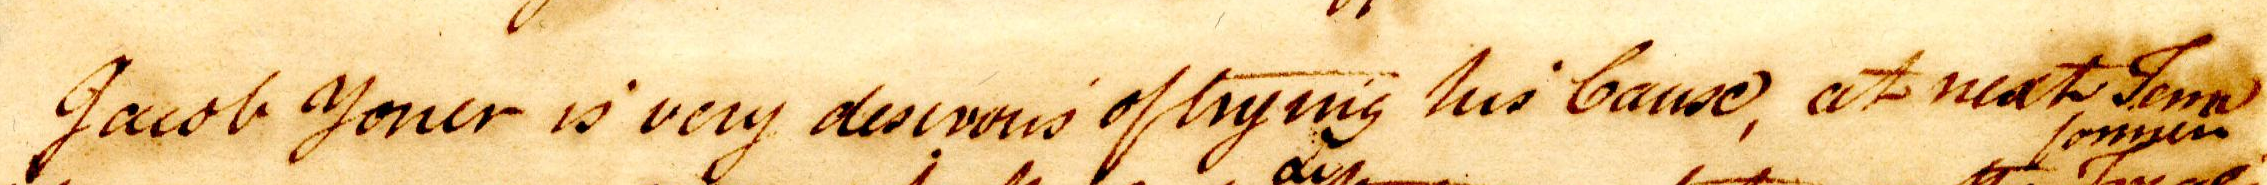Jacob Yoner is very desirous of trying his Cause, at next Town
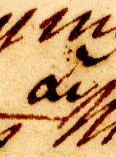as
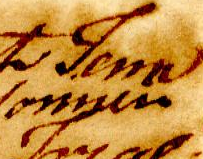former
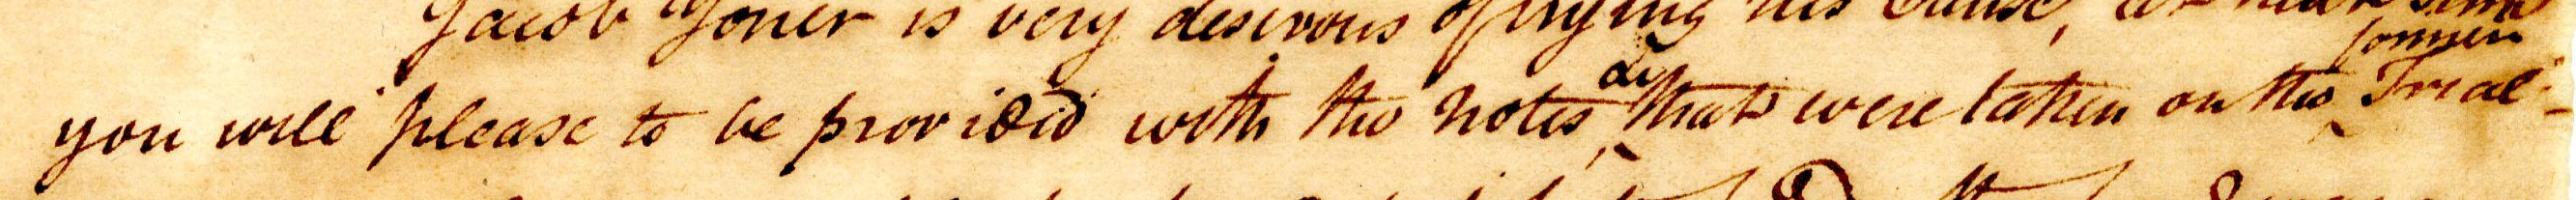you will please to be provided with the noters ^ that were taken on this ^ Trial
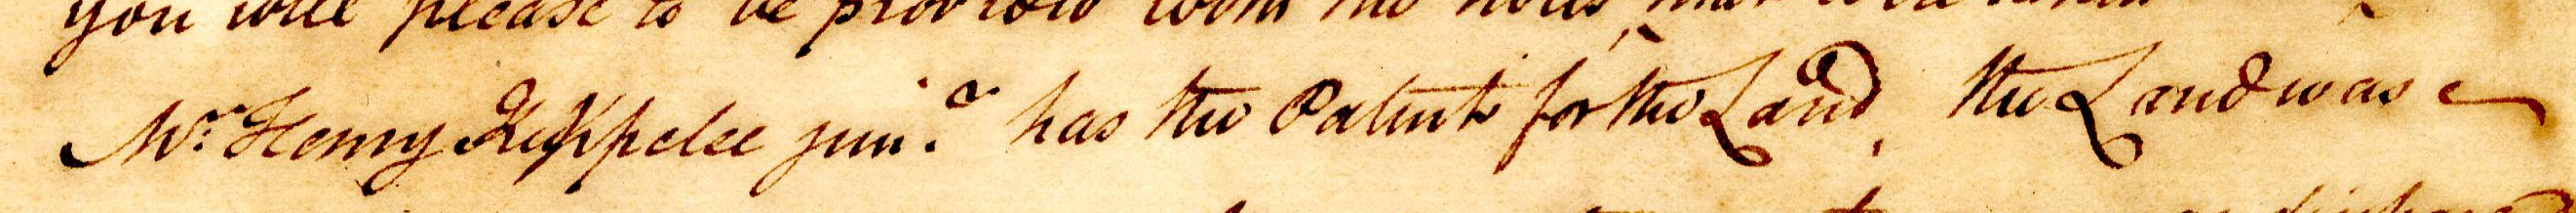M^r Henry Keppelee jun^r. has the Patent for the Land, the Land was
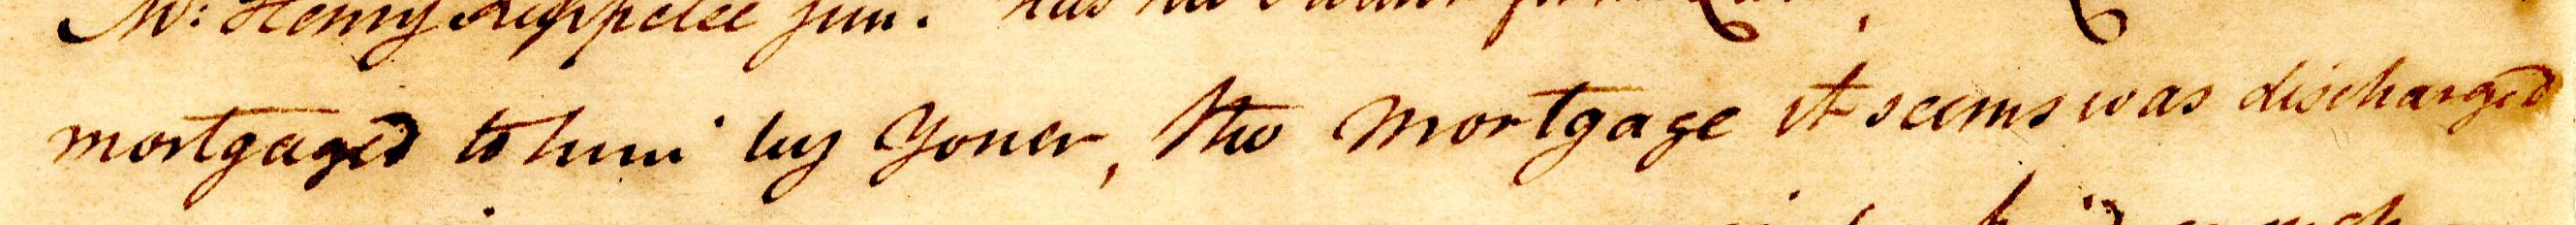mortgaged to him by Yoner, the mortgage it seems was discharged
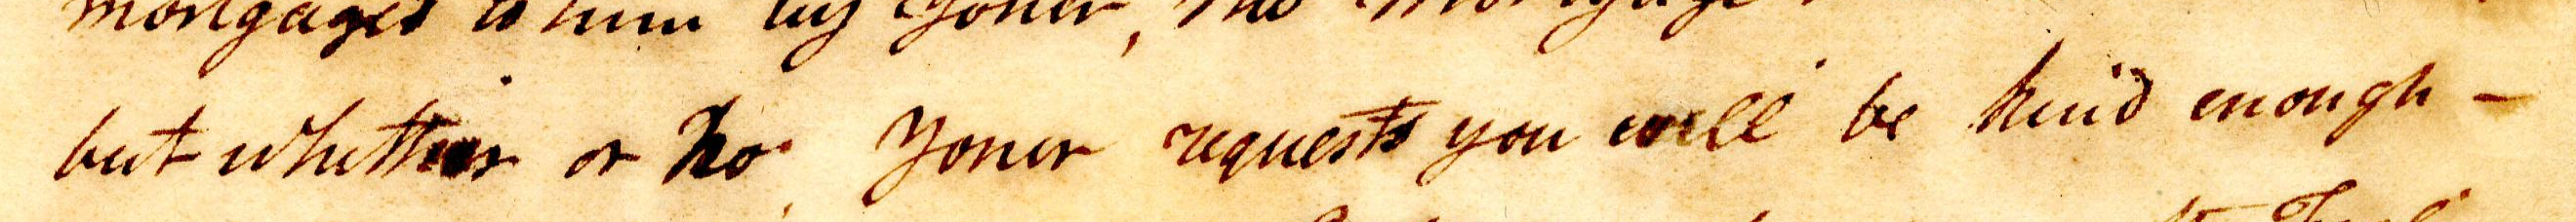but whether or no Yoner requests you will be kind enough
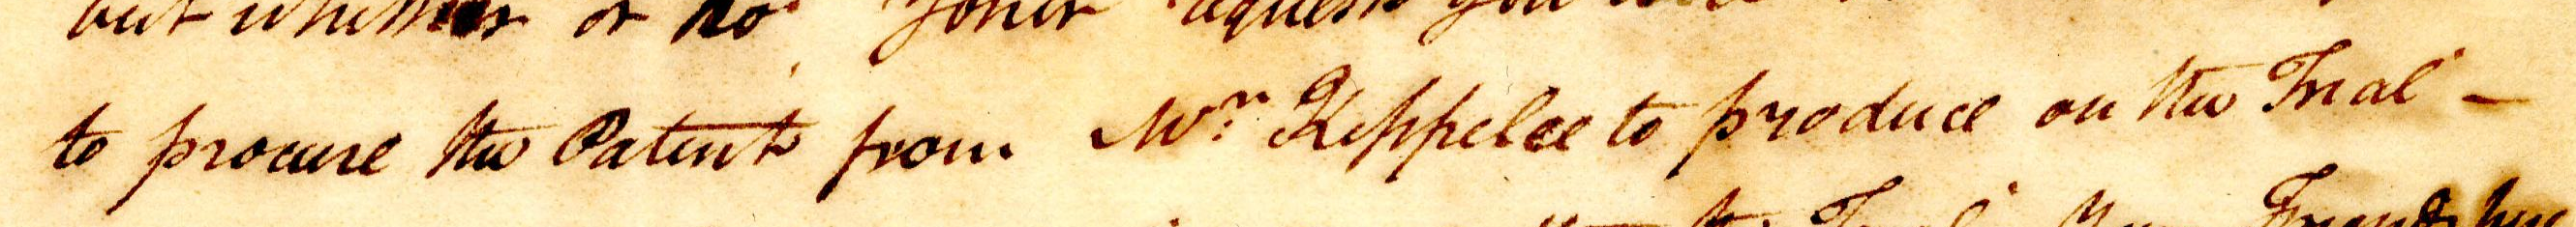to procure the Patents from M^r Keppelee to produce on the Trial
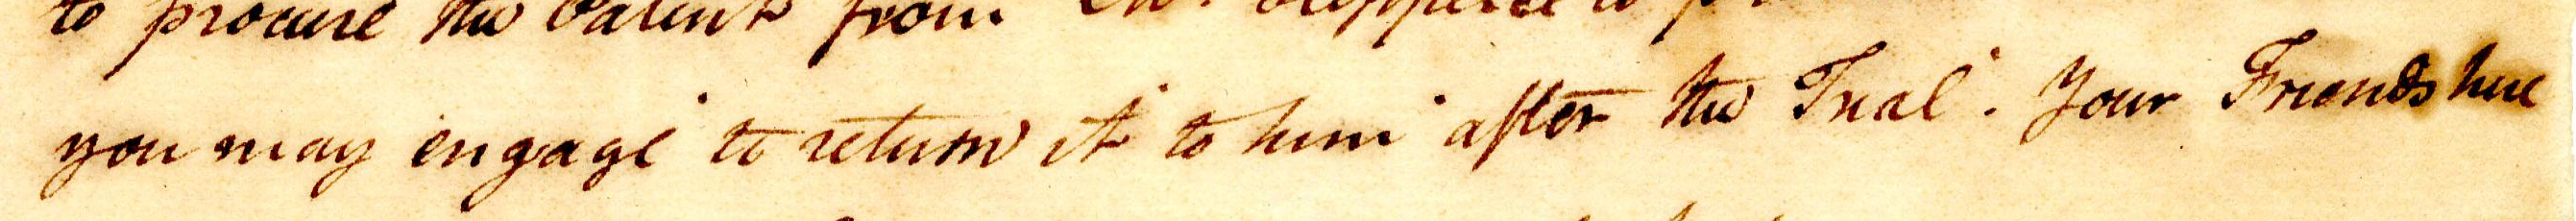you may engage to return it to him after the Trial. Your Frends here
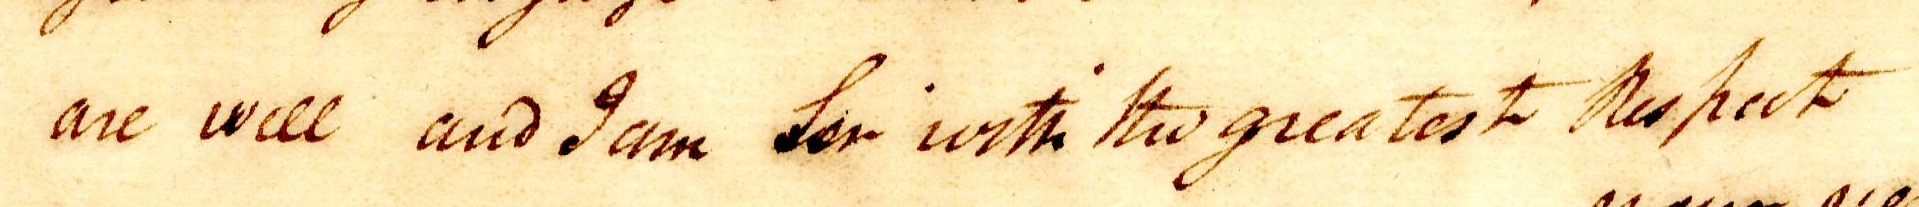are well, and I am Sir with the greatest Respect
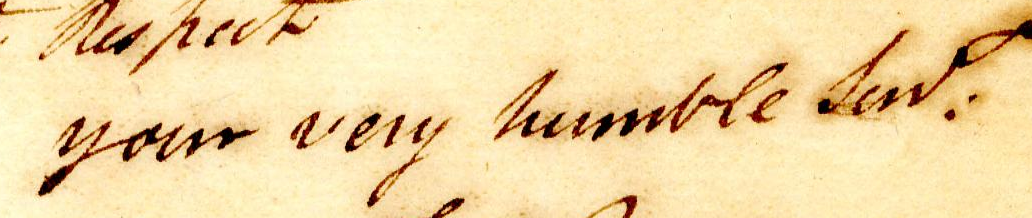your very humble Serv^t.
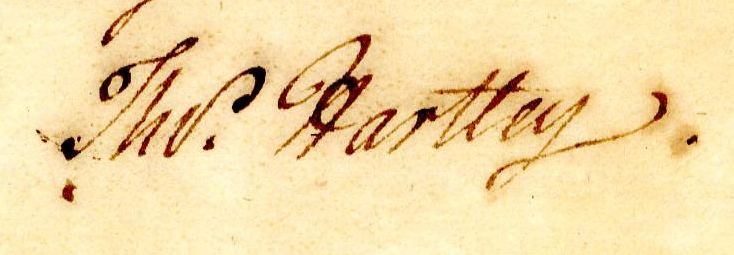Tho^s. Hartley
